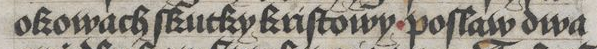okowach ſkutky kriſtowy.poſlaw dwa
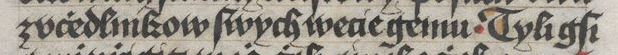zvċedlníkow ſwych wecie gemu.Tyli gſi
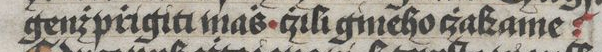genż pṙigiti maṡ.cżili gineho cżakame?
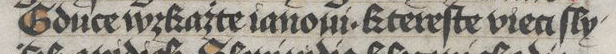Gduce wzkażte ianoui.ktereſte vieci ſly¬
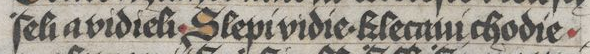ẛeli a vidieli.Slepí vidíe.klecaui chodíe.
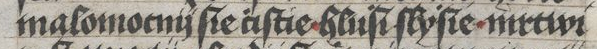malomocnij ſie ċiſtie.hluẛi ſlyẛie.mrtwí
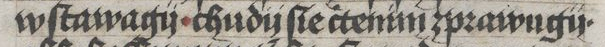wſtawagij.chudij ſie ċtenim zprawugij.
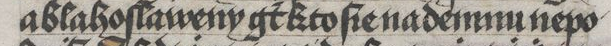a blahoſlaweny ḡt kto ſie nademnu nepo¬
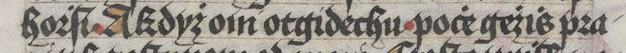horẛi.Akdyż oni otgidechu.poċe geżiṡ pra¬
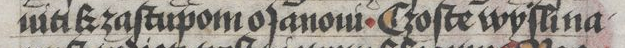uiti k zaſtupom o Ianoui.Czoſte wyẛli na¬
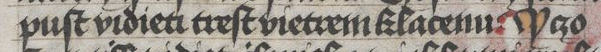puſt vidieti treſt vietrem klacenu?Yczo
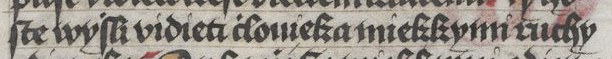ſte wyẛli vidieti ċlouieka miekkymi ruchy
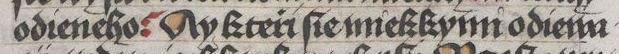odieneho?Ay kteṙí ſie niekkymi odiewa¬
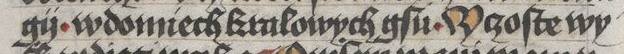gij.wdomiech kralowych gſu.Yczo ſte wy¬
